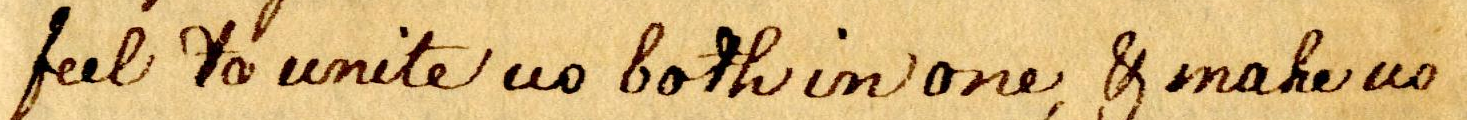feel to unite us both in one & make us
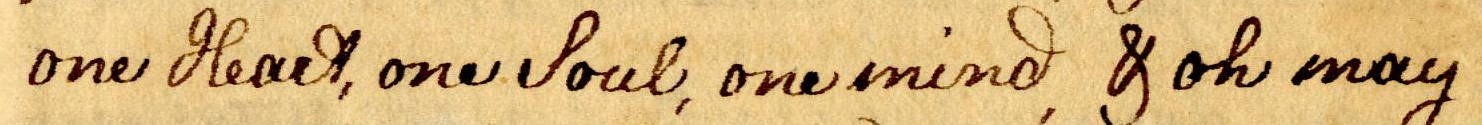one Heart, one Soul one mind & oh may
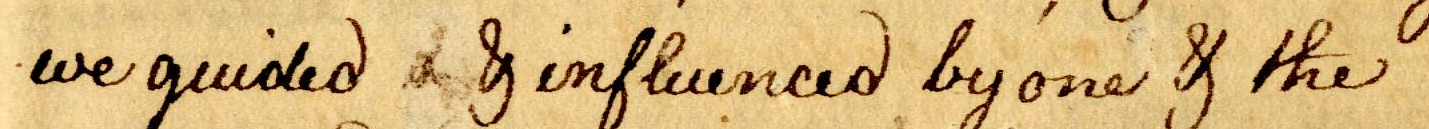we guided & influenced by one & the
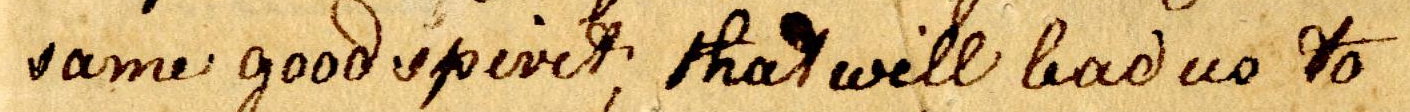same good spirit that will lead us to
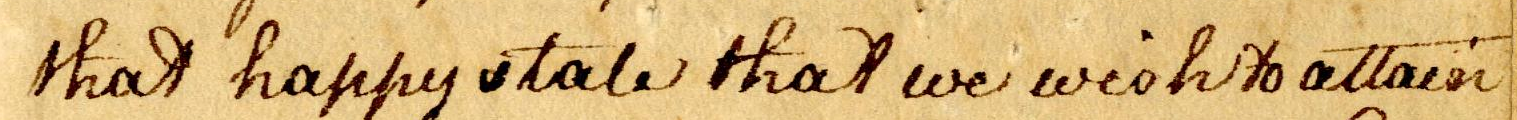that happy stale that we wish to attain
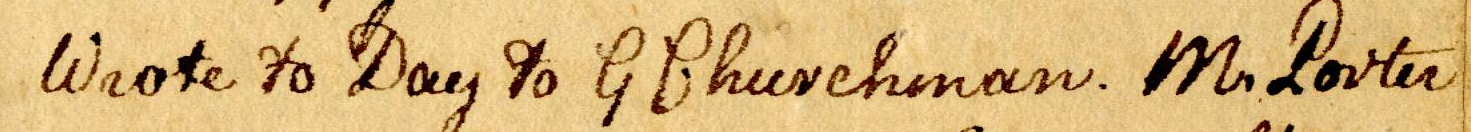Wrote to Day to G Churchman. M Porter
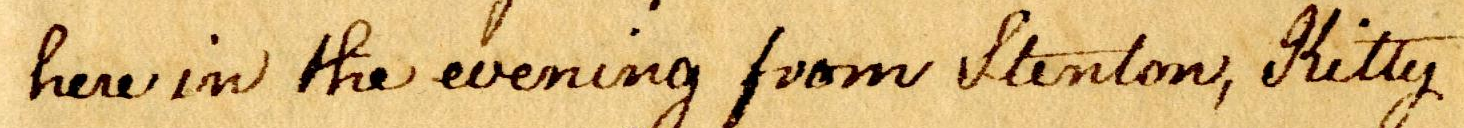here in the evening from Stenton, Kitty
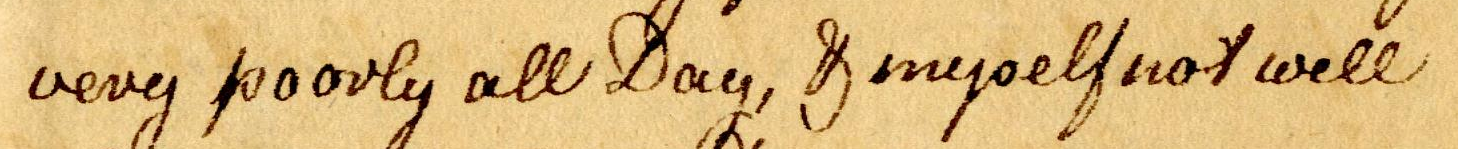very poorly all Day, & myself not will
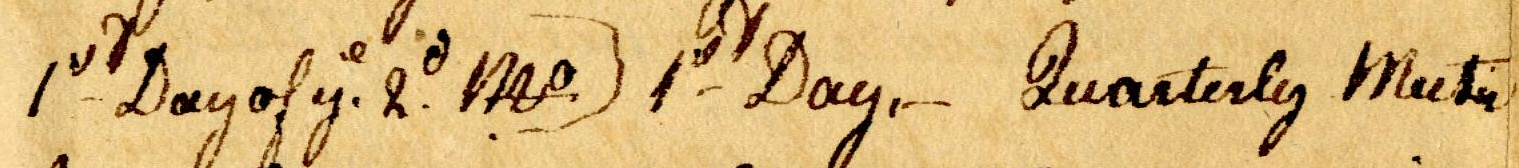1^st Day of y^e. 2^d. M^o) 1^st Day.- Quarterly Meetin
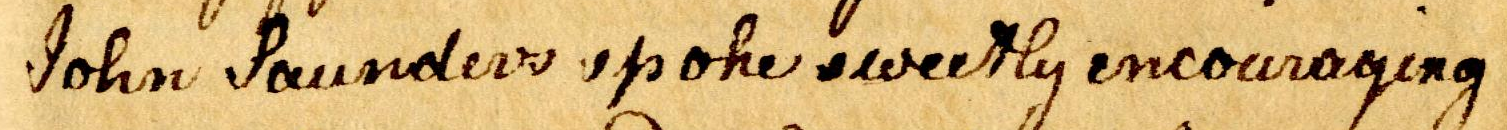John Saunders spoke sweetly encouraging
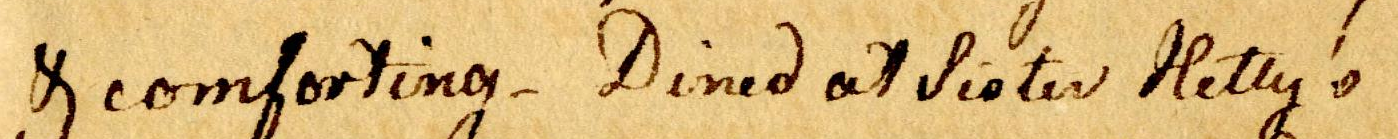& comforting- Dined at Sister Hetty's
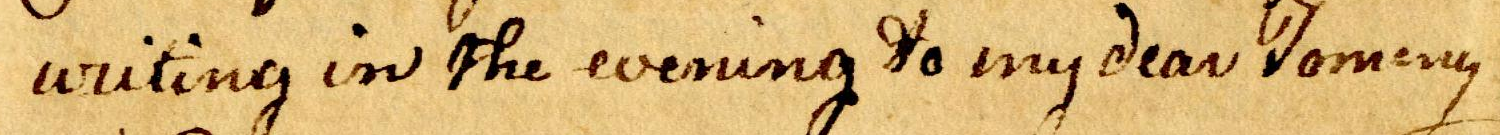writing in the evening to my dear Tommy
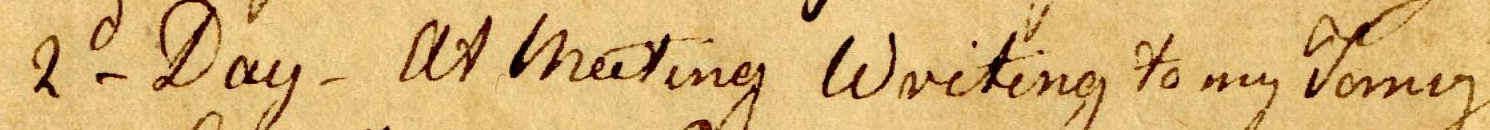2^d Day- At Meeting Writing to my Tomy
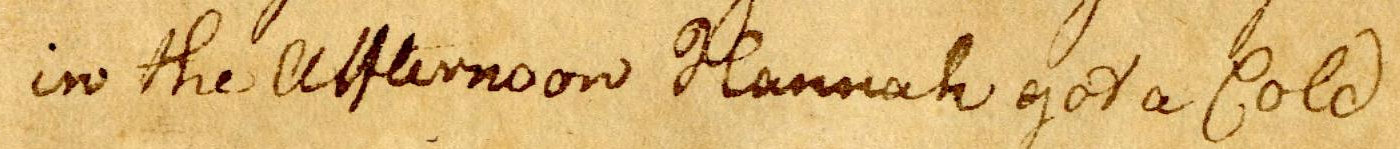in the Affternoon Hannah got a Cold
